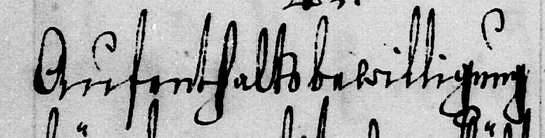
Aufenthaltsscheines
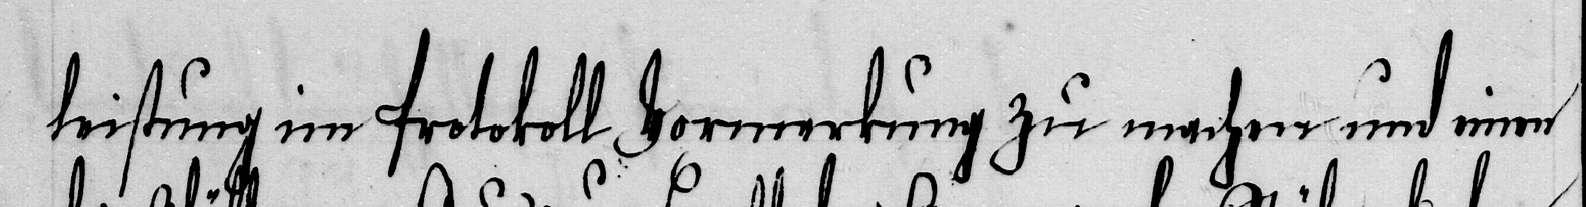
leistung im Protokoll Vormerkung zu machen und einen
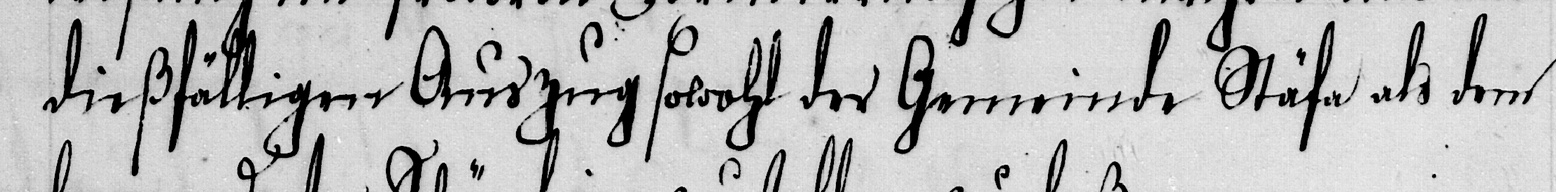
dießfälligen Auszug sowohl der Gemeinde Stäfa als dem
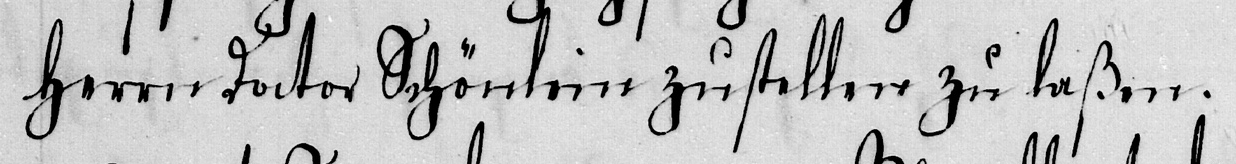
Herrn Doctor Schönlein zustellen zu laßen.
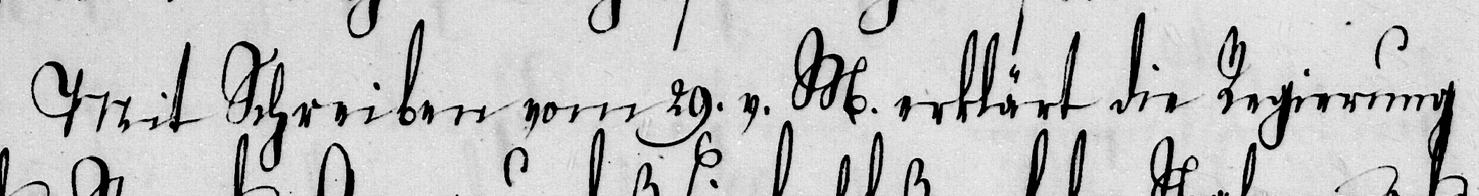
Mit Schreiben vom 29. v. M. erklärt die Regierung
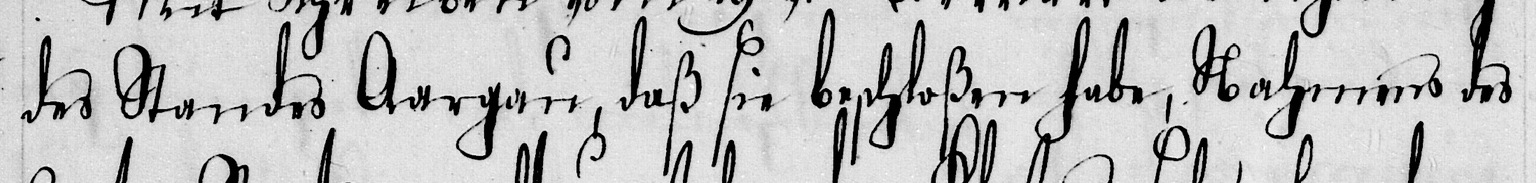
des Standes Aargau, daß sie beschloßen habe, Nahmens des
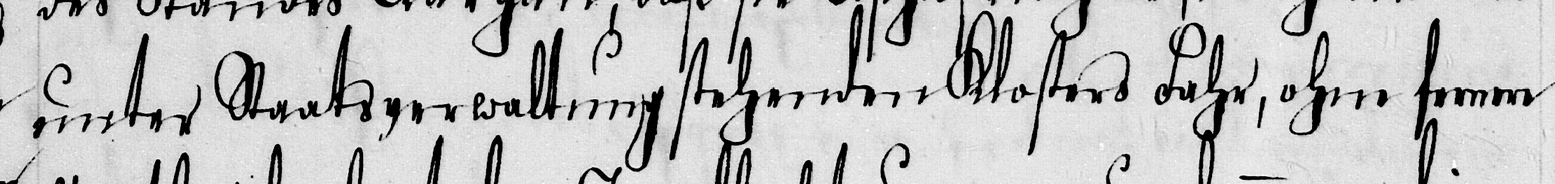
unter Staatsverwaltung stehenden Klosters Fahr, ohne fernere
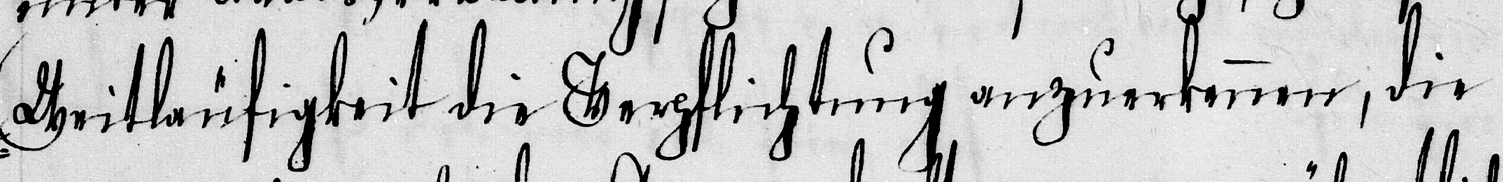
Weitläufigkeit die Verpflichtung anzuerkennen, die
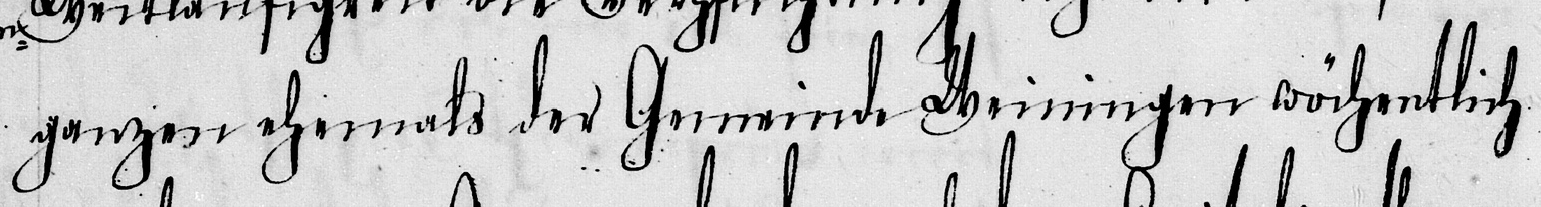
ganzen ehemals der Gemeinde Weiningen wöchentlich
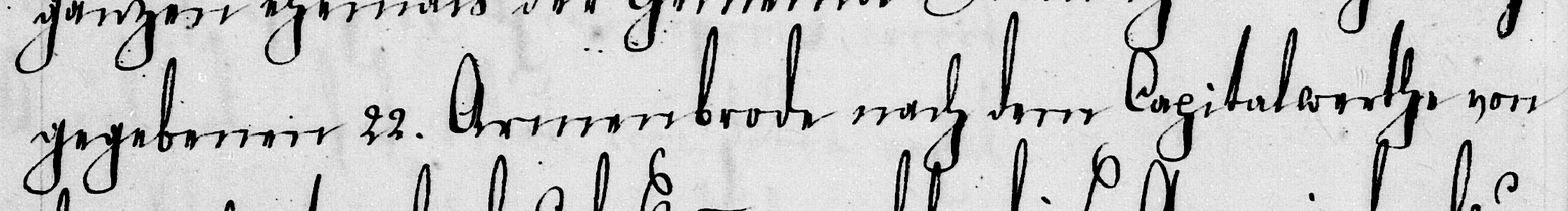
gegebenen 22. Armenbrode nach dem Capitalwerthe von
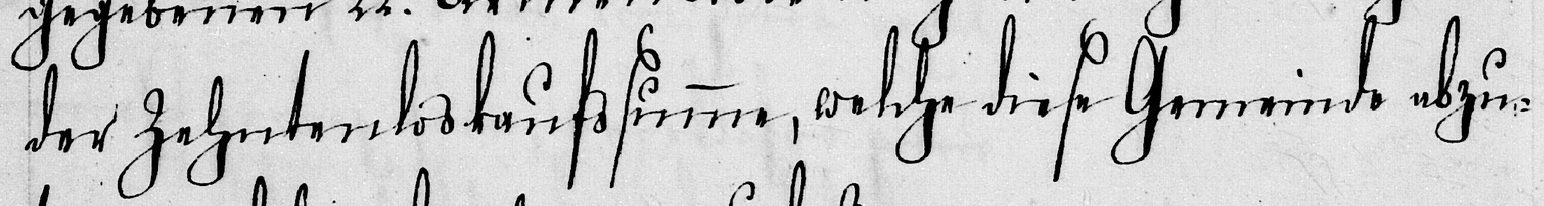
der Zehntenloskaufssumme, welche diese Gemeinde abzu¬
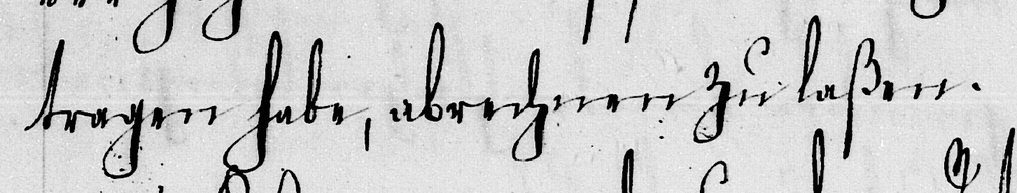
tragen habe, abrechnen zu laßen.
